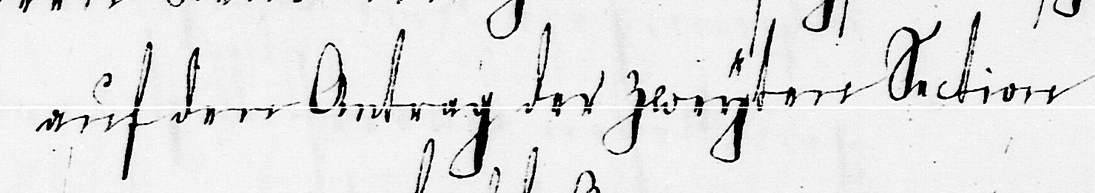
auf den Antrag der zweyten Section
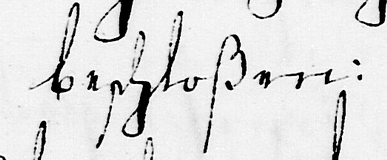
beschloßen:
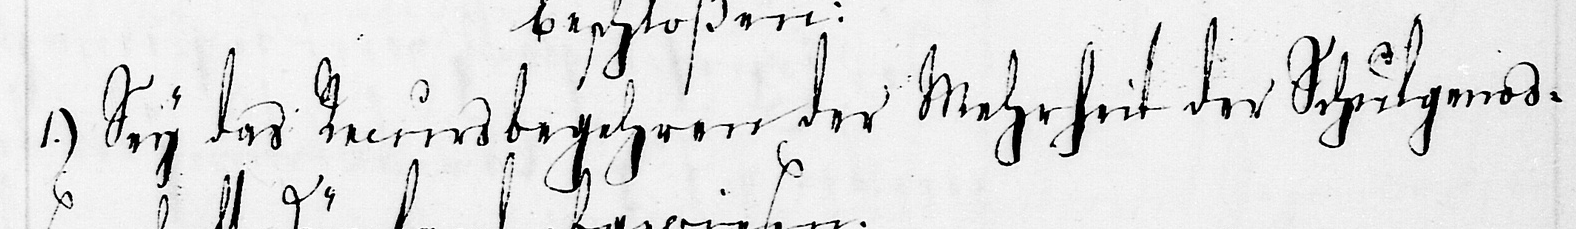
1.) Sey das Recursbegehren der Mehrheit der Schulgenoß¬
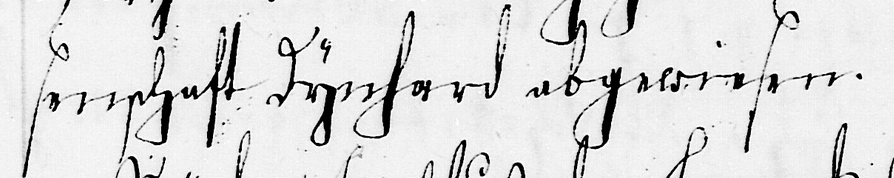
enschaft Dynhard abgewiesen.
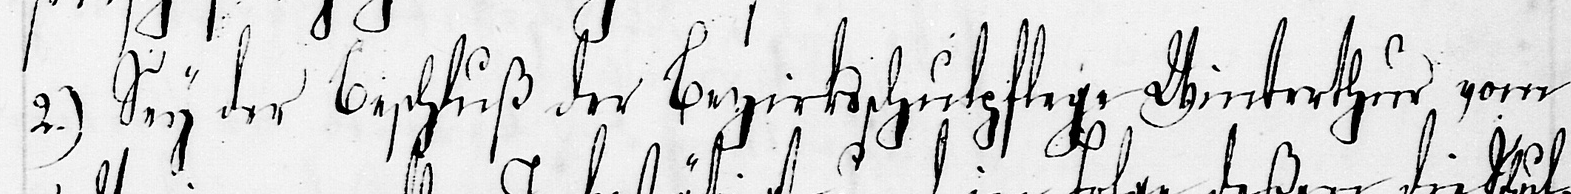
2.) Sey der Beschluß der Bezirksschulpflege Winterthur vom
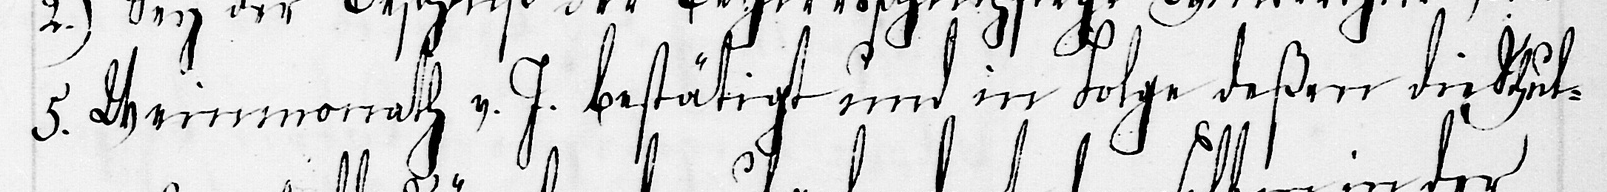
5. Weinmonath v. J. bestätigt und in Folge deßen die Schul¬
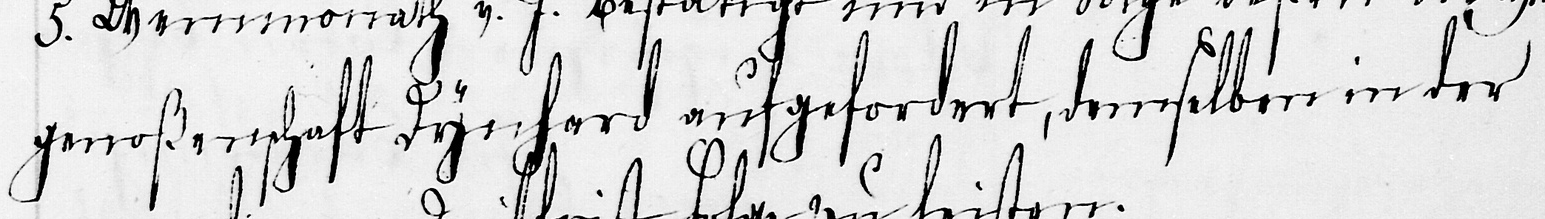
genoßenschaft Dynhard aufgefordert, demselben in der
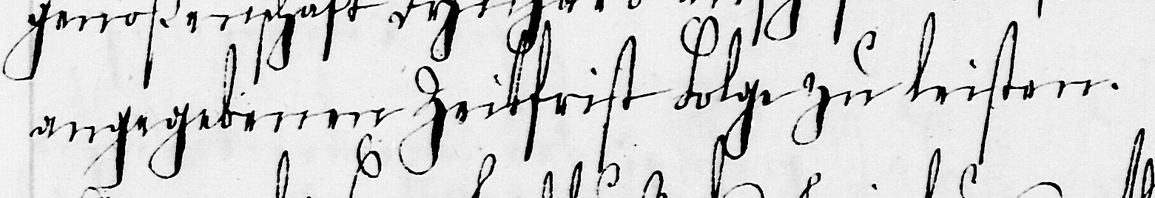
angegebenen Zeitfrist Folge zu leisten.
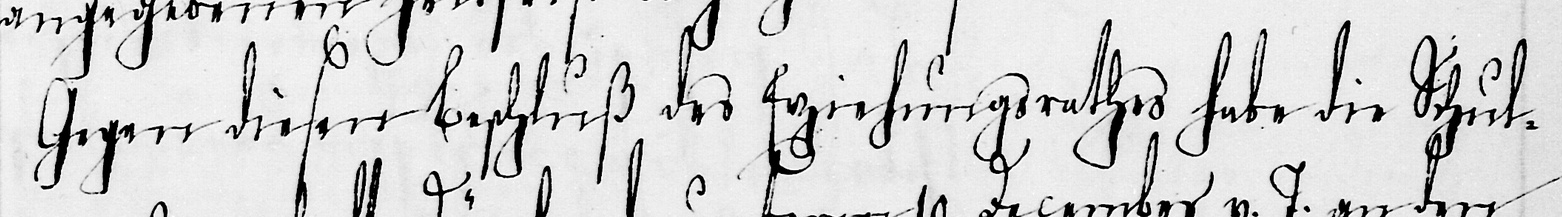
Gegen diesen Beschluß des Erziehungsrathes habe die Schul¬
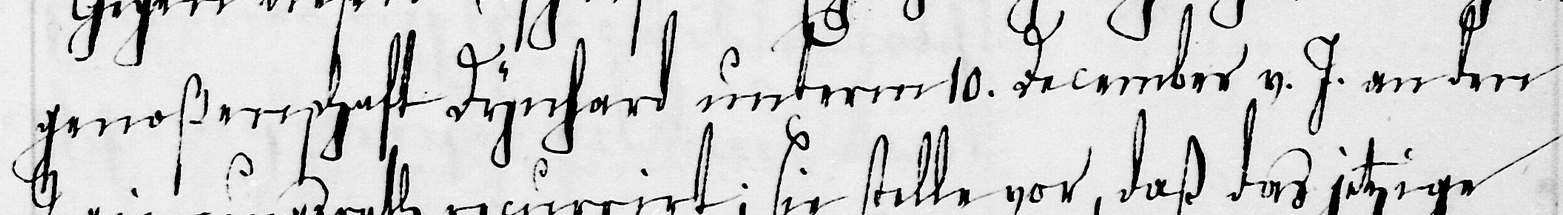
genoßenschaft Dynhard unterm 10. December v. J. an den
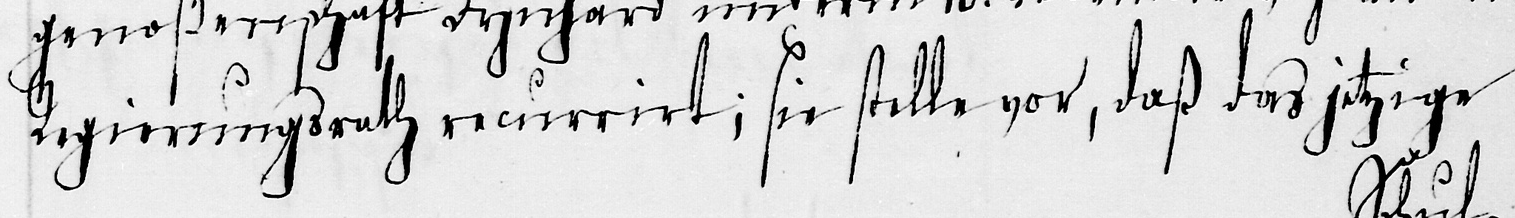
Regierungsrath recurrirt; sie stelle vor, daß das jetzige
